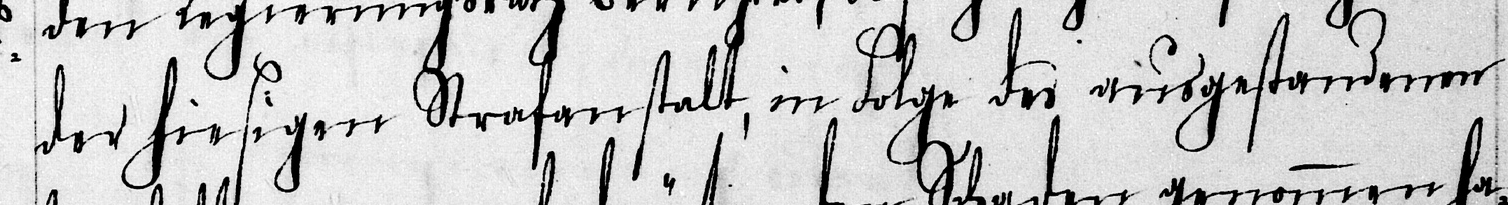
der hiesigen Strafanstalt, in Folge des ausgestandenen
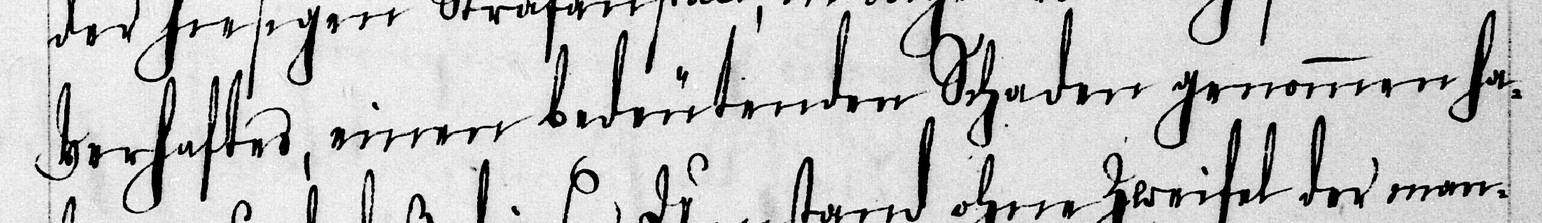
Verhaftes, einen bedeutenden Schaden genommen ha¬
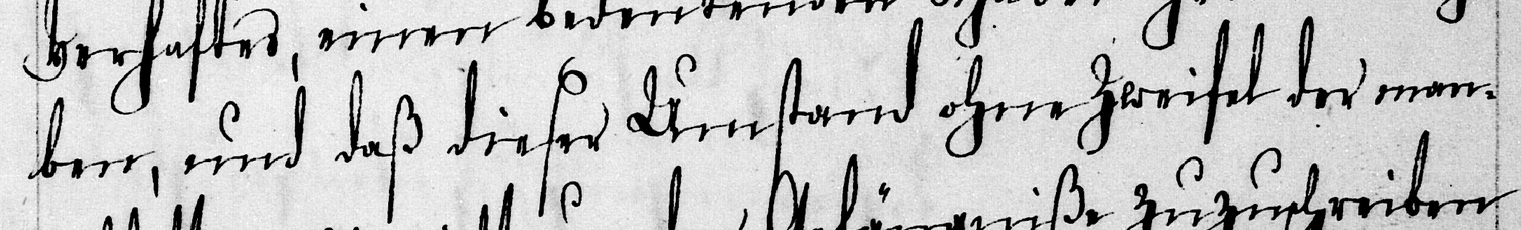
ben, und daß dieser Umstand ohne Zweifel der man¬
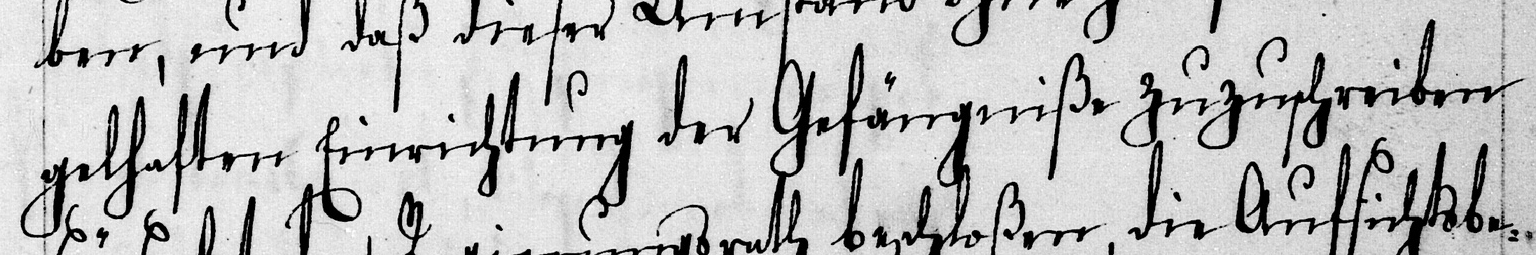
gelhaften Einrichtung der Gefängniße zuzuschreiben
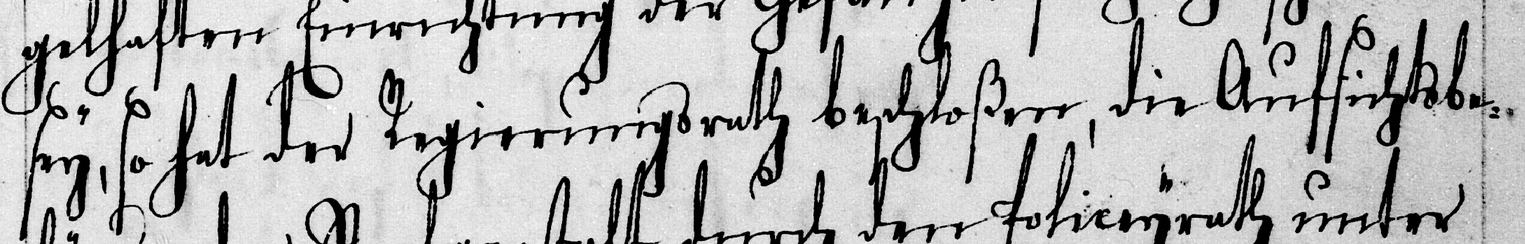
so hat der Regierungsrath beschloßen, die Aufsichtsbe¬
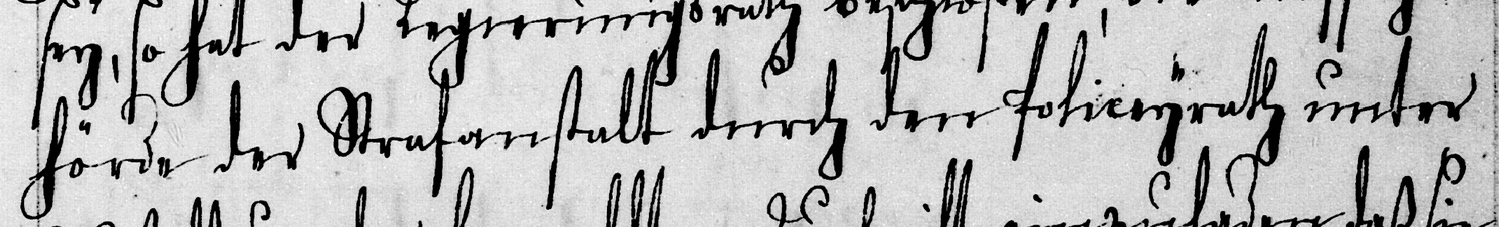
hörde der Strafanstalt durch den Policeyrath unter
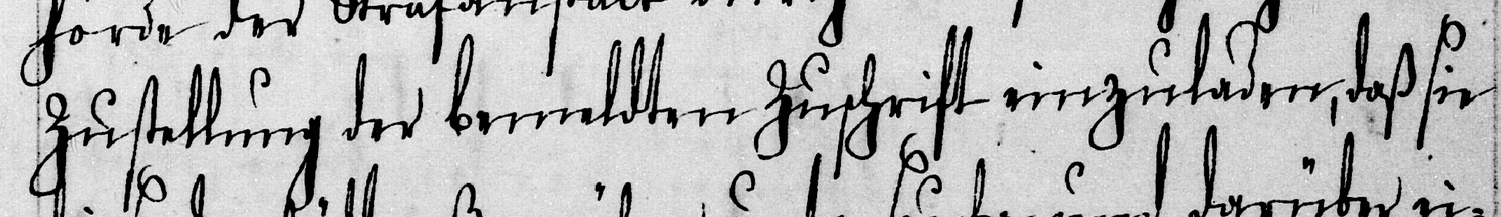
Zustellung der bemeldten Zuschrift einzuladen, daß sie
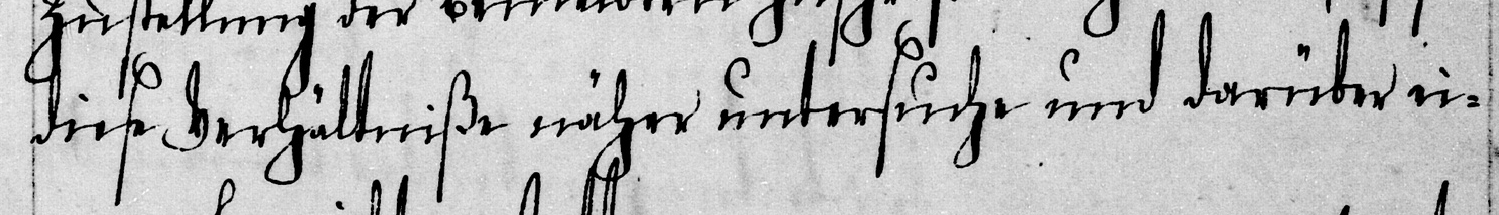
diese Verhältniße näher untersuche und darüber ei¬
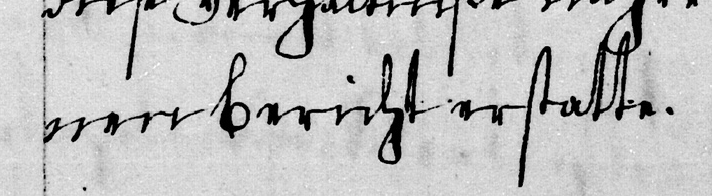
nen Bericht erstatte.
